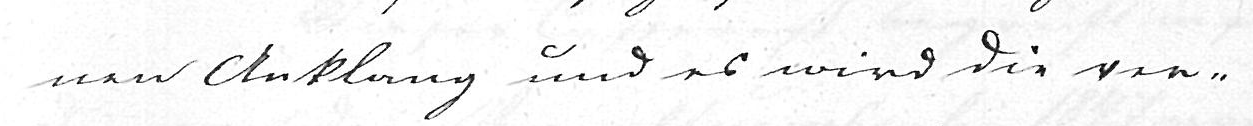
nen Anklang und es wird die ver-
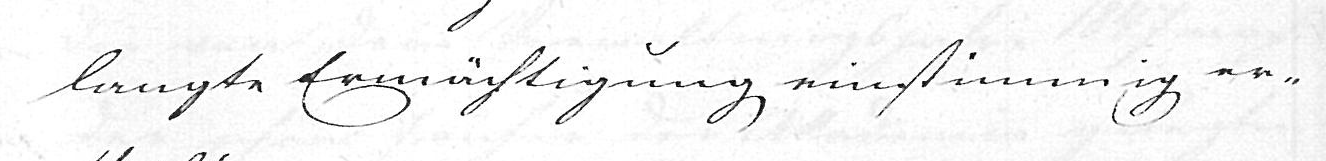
langte Ermächtigung einstimmig er-
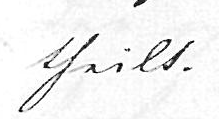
theilt.
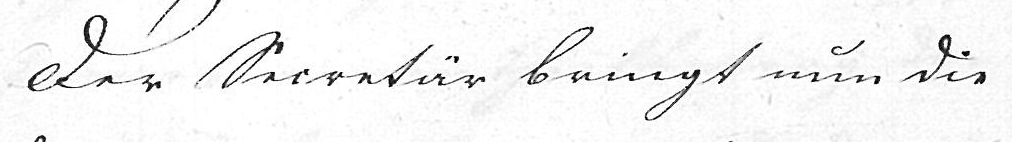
Der Secretär bringt nun die
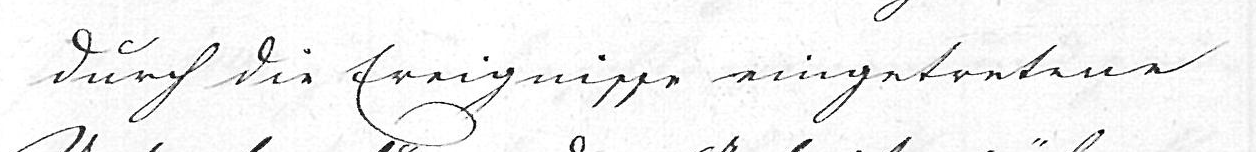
durch die Ereignisse eingetretene
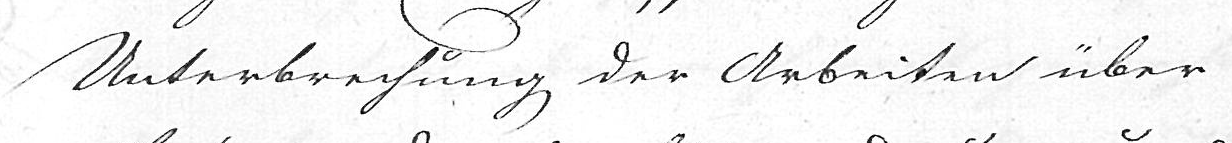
Unterbrechung der Arbeiten über
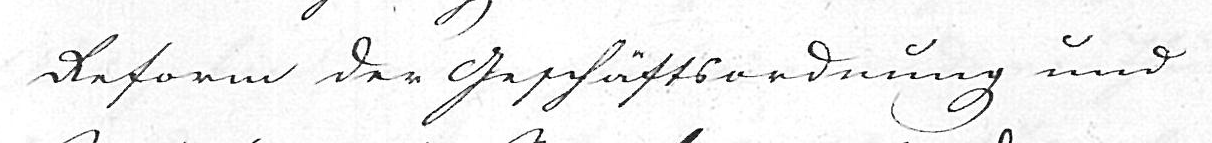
Reforn der Geschäftsordnung und
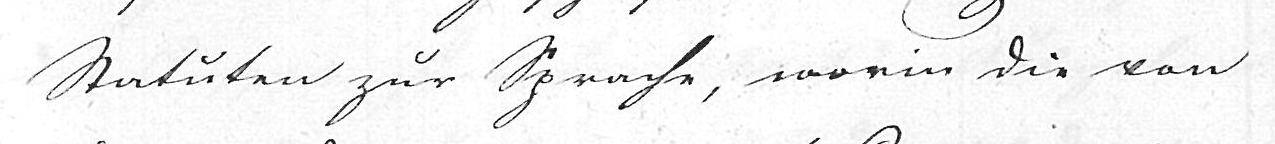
Statuten zur Sprache, worin die von
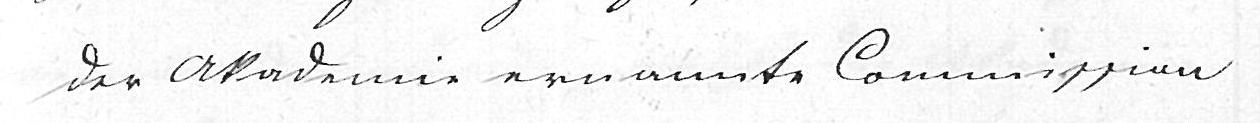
der Akademie ernannte Commission
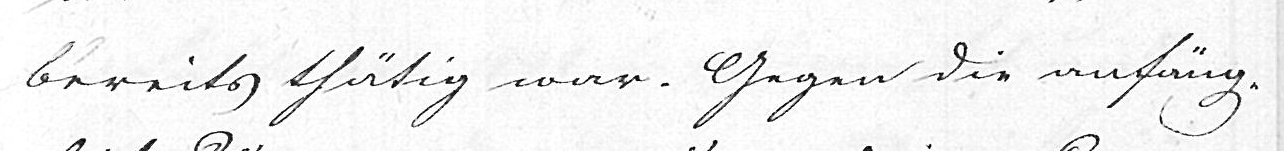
bereits thätig war. Gegen die anfäng-
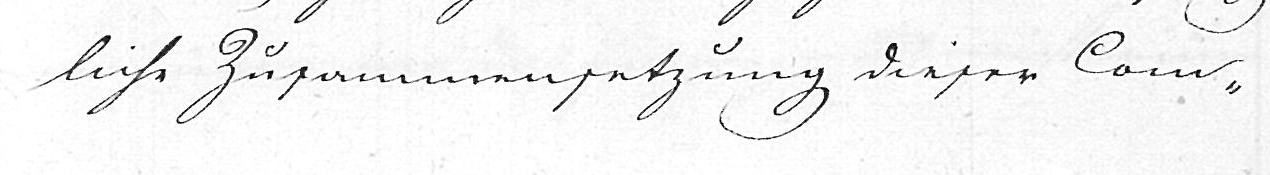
liche Zusammenpetzung dieser Com-
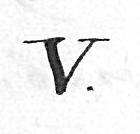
V.
